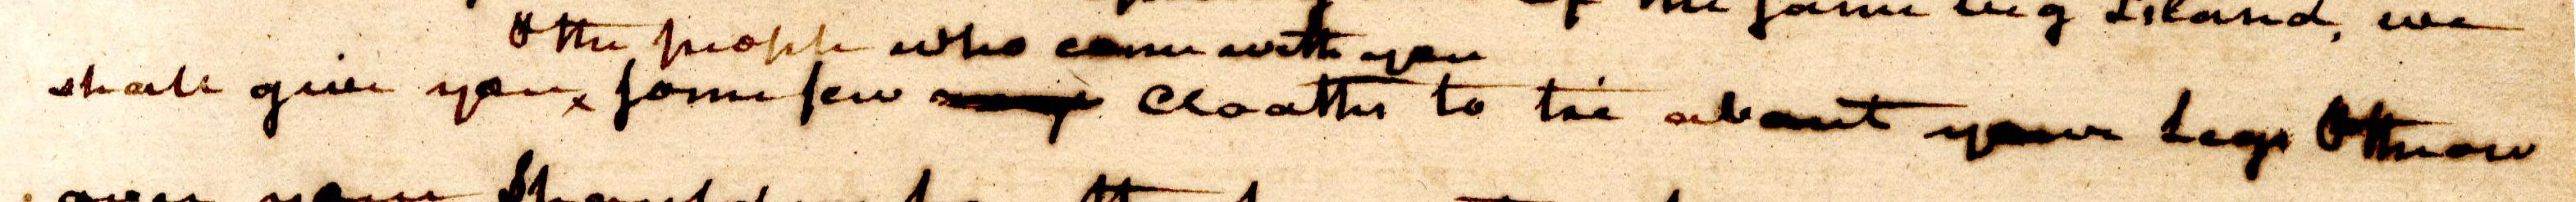shall give you ^ some few [rags] Cloaths to tie about your Legs & throw
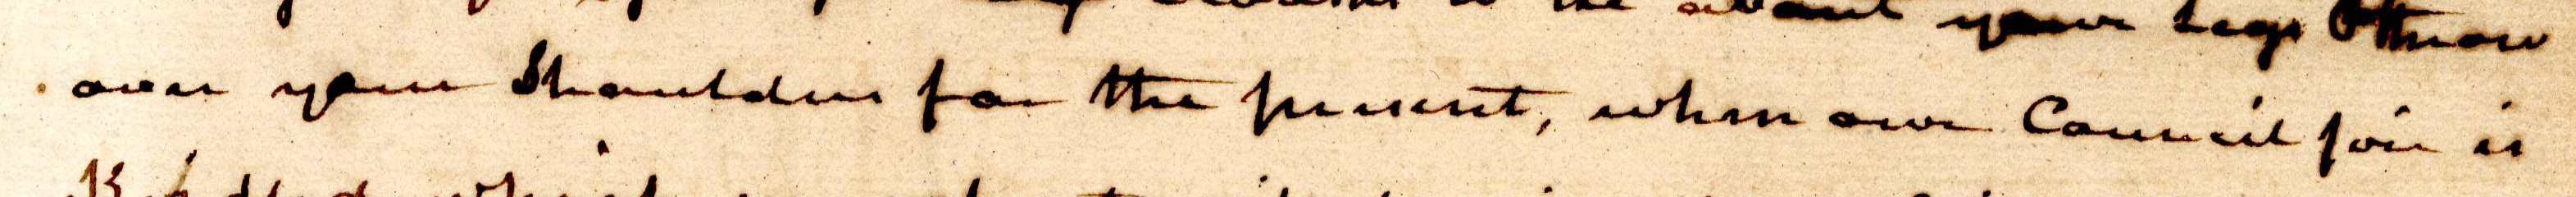over your Shoulders for the present, when our Council fire is
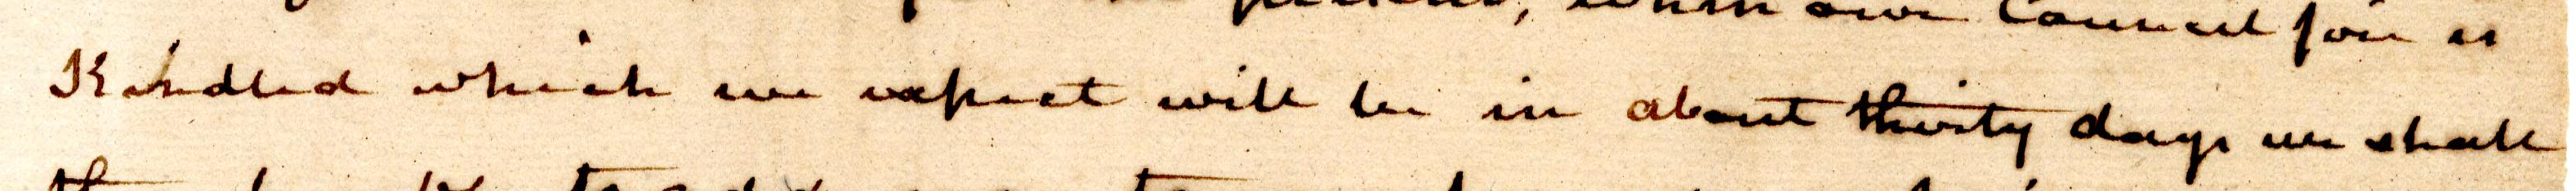kindled which we expect will be in about thirty days we shall
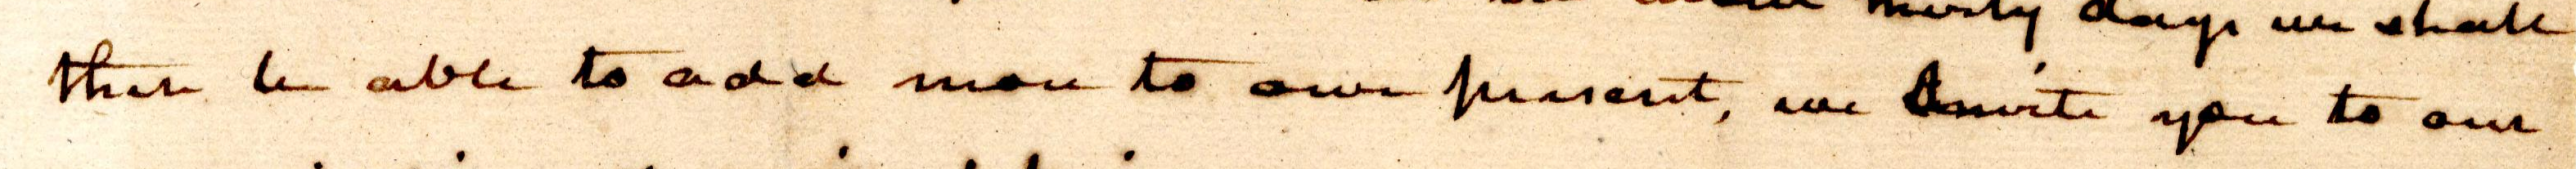then be able to add more to our present, we Invite you to our
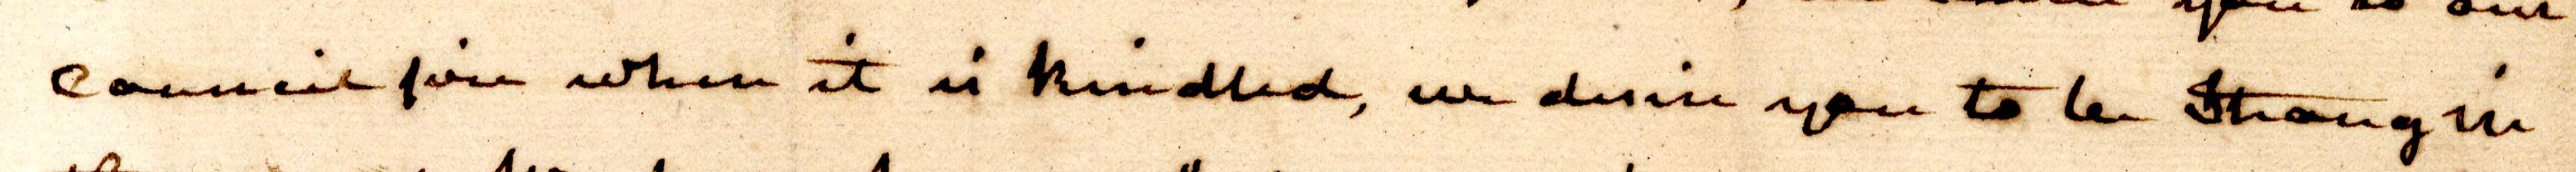Council fire when it is kindled, we desire you to be Stronger
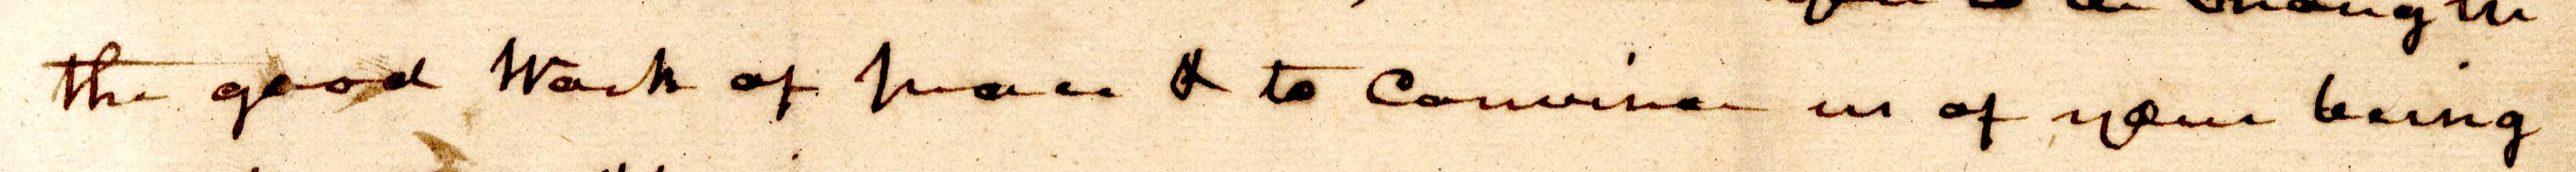the good Work of Peace & to Convince us of your being
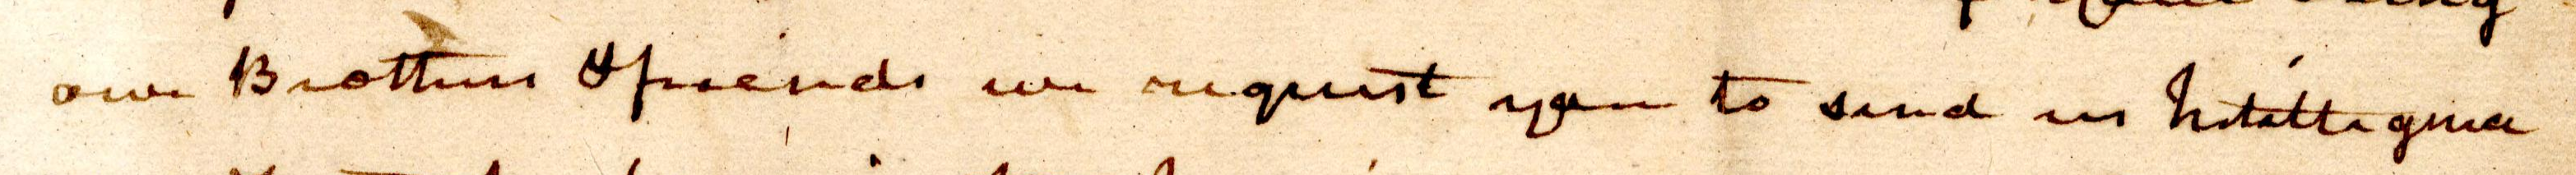our Brothers & friends we request you to send us Intelligence
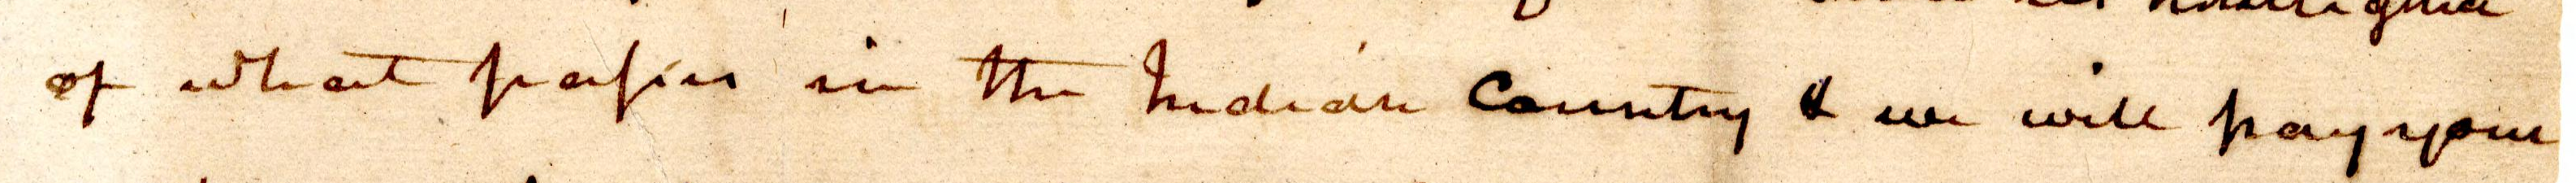of what passes in the Indian Country & we will pay your
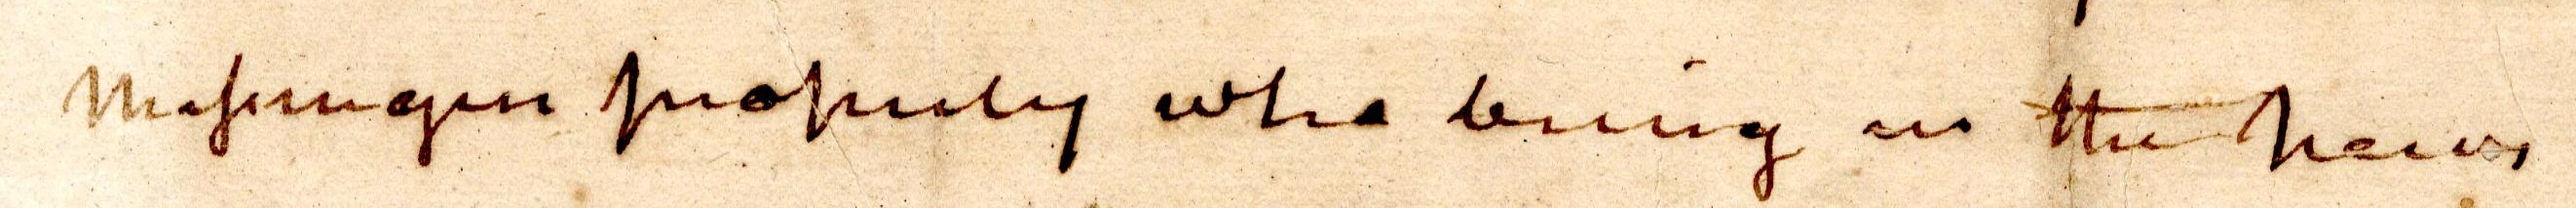masenger properly who bring us the News
